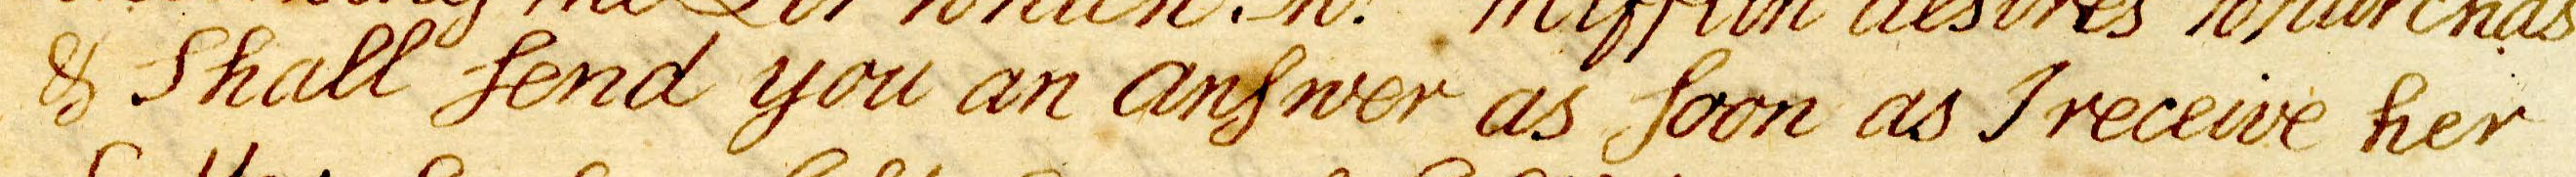& Shall send you an answer as soon as I receive her
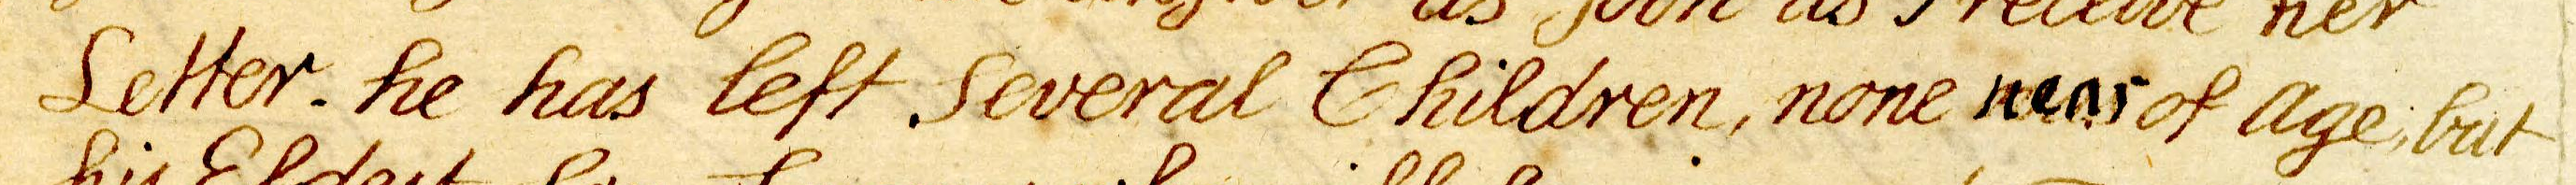Letter. he has left several Children, none near of Age, but
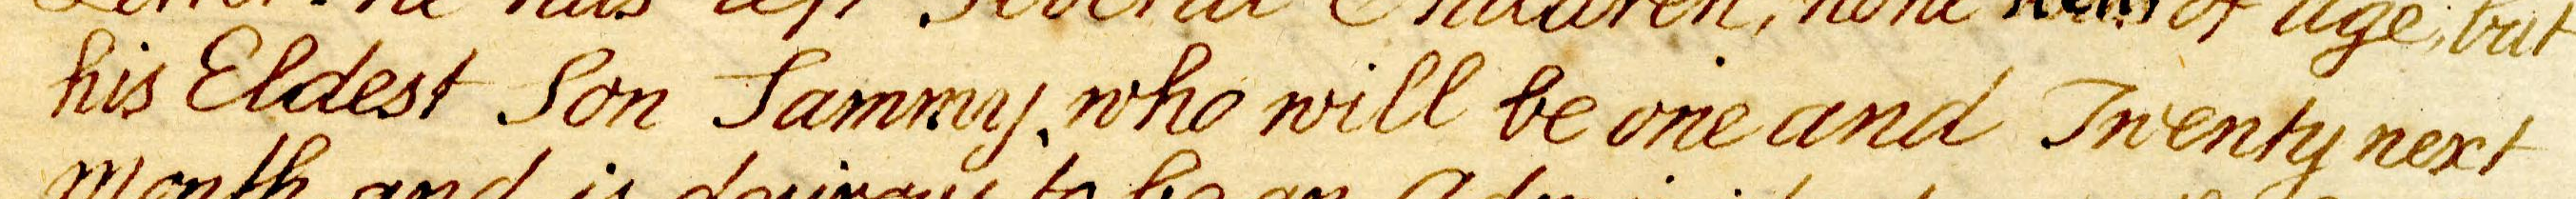his Eldest son Sammy, who will be one and Twenty next
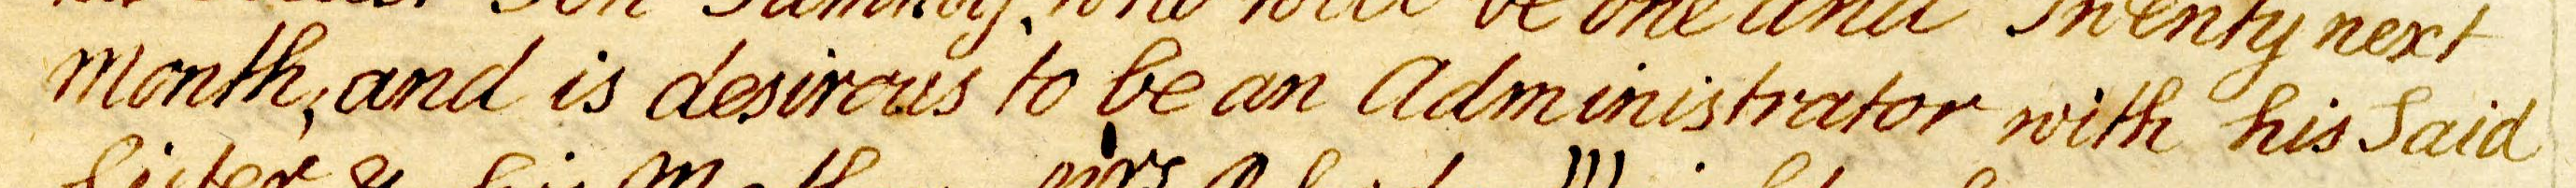Month, and is desirous to be an Administrator with his said
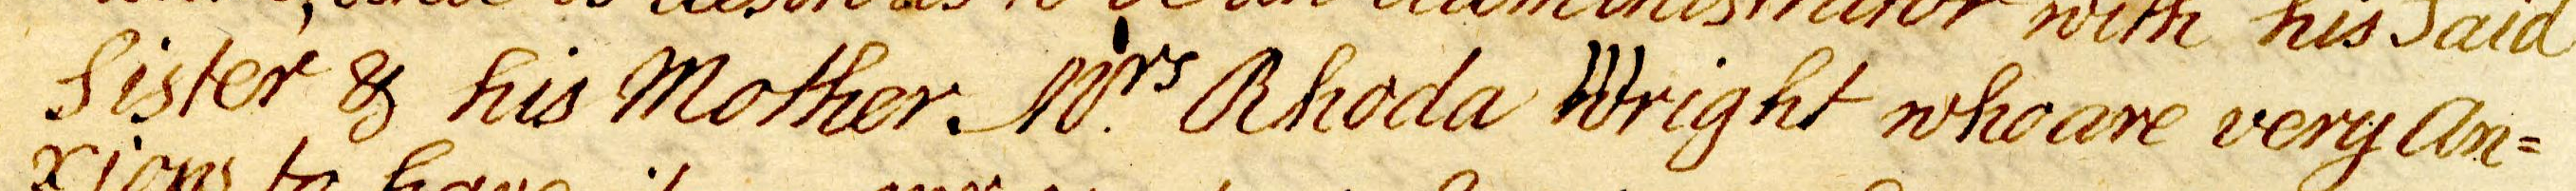Sister & his Mother M.^rs Rhoda Wright who are very An-
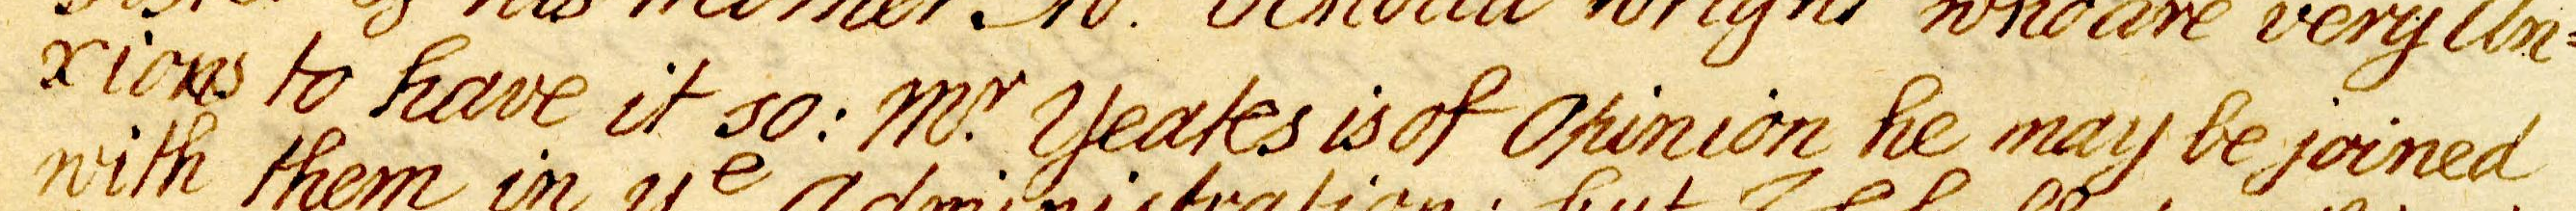xious to have it so: M^r. Yeates is of Opinion he may be joined
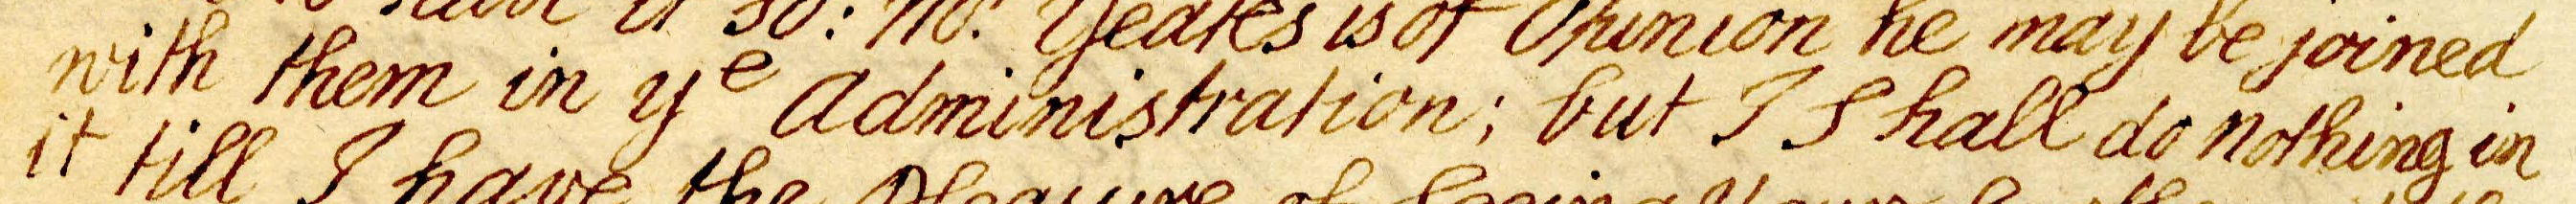with them in y^e administration; but I shall do nothing in
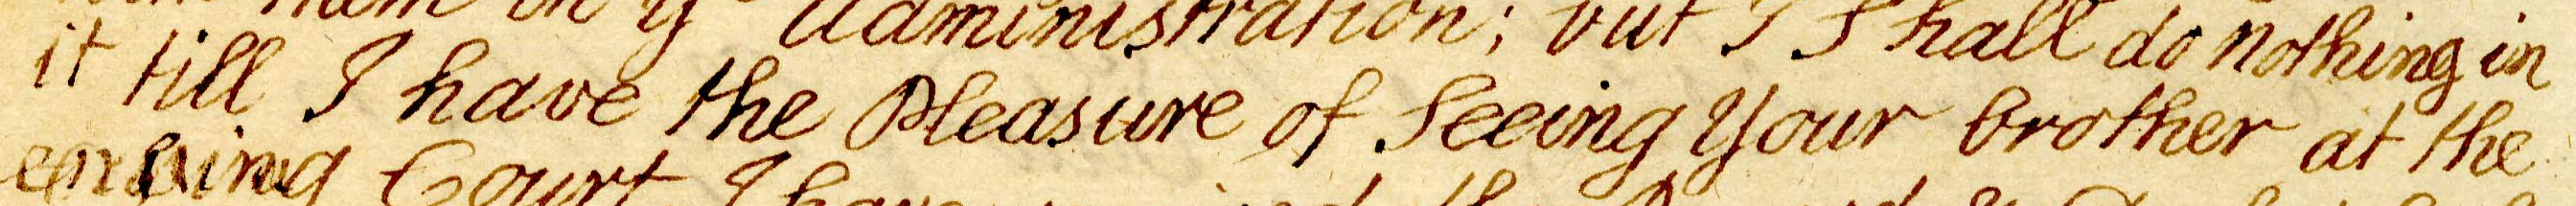it till I have the Pleasure of Seeing Your brother at the
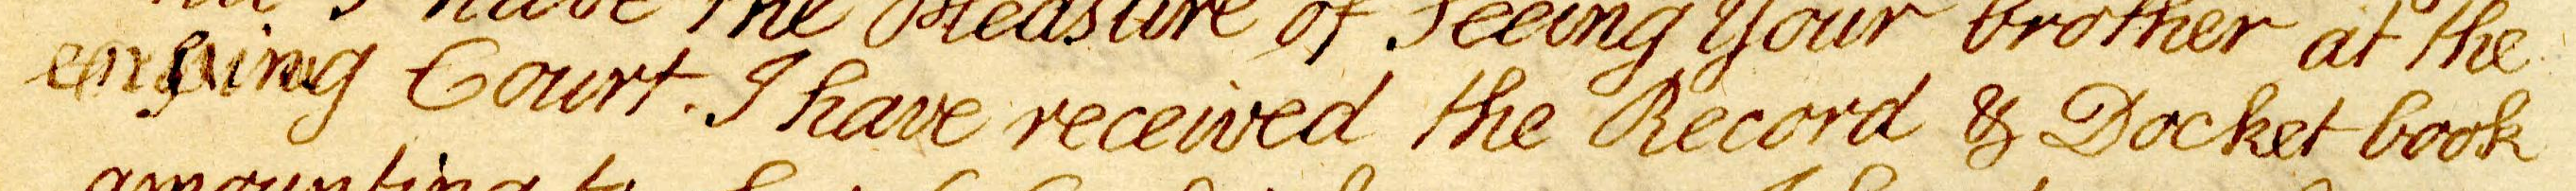ensuing Court. I have received the Record & Docket book
